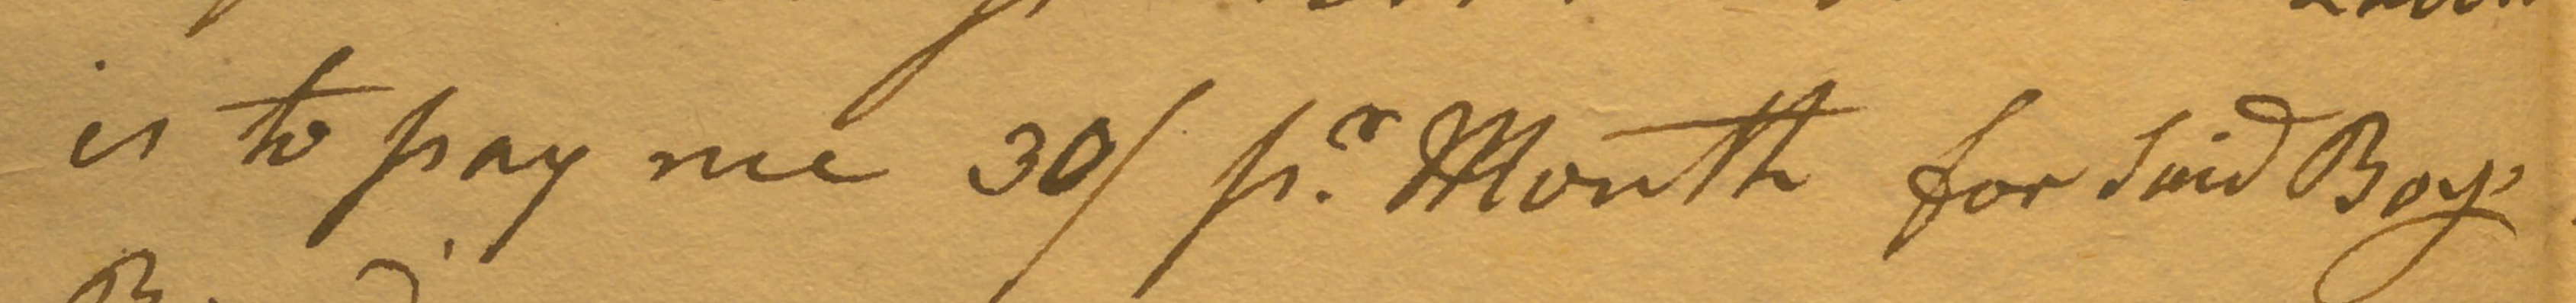is to pay me 30s p^r. Month for said Boys
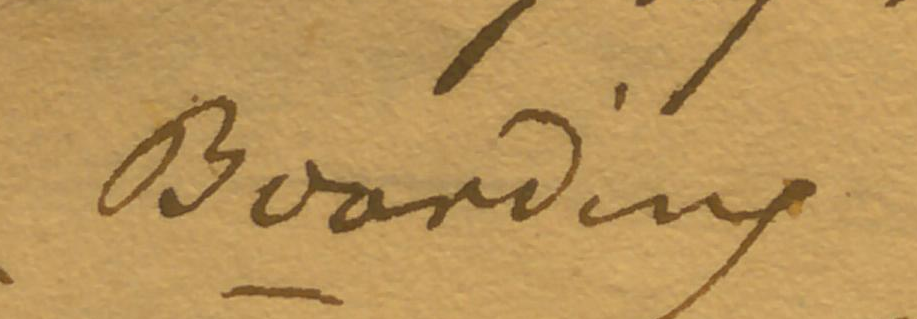Boarding
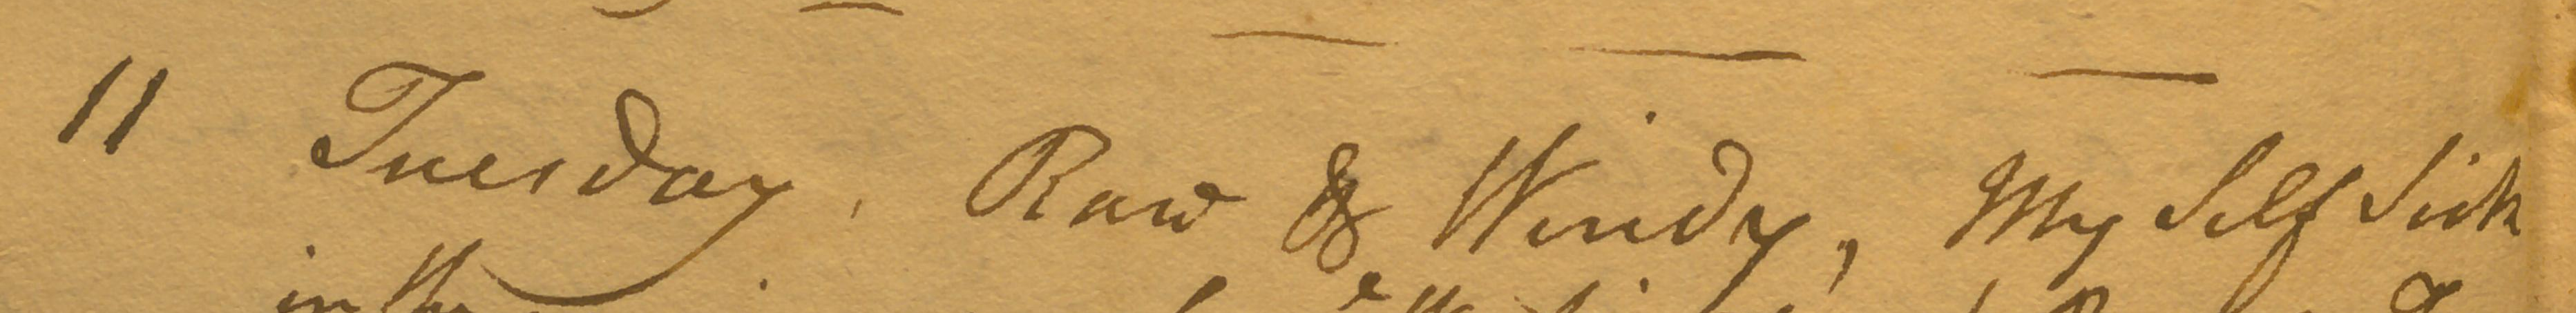11 Tuesday. Raw & Windy My Self Sick
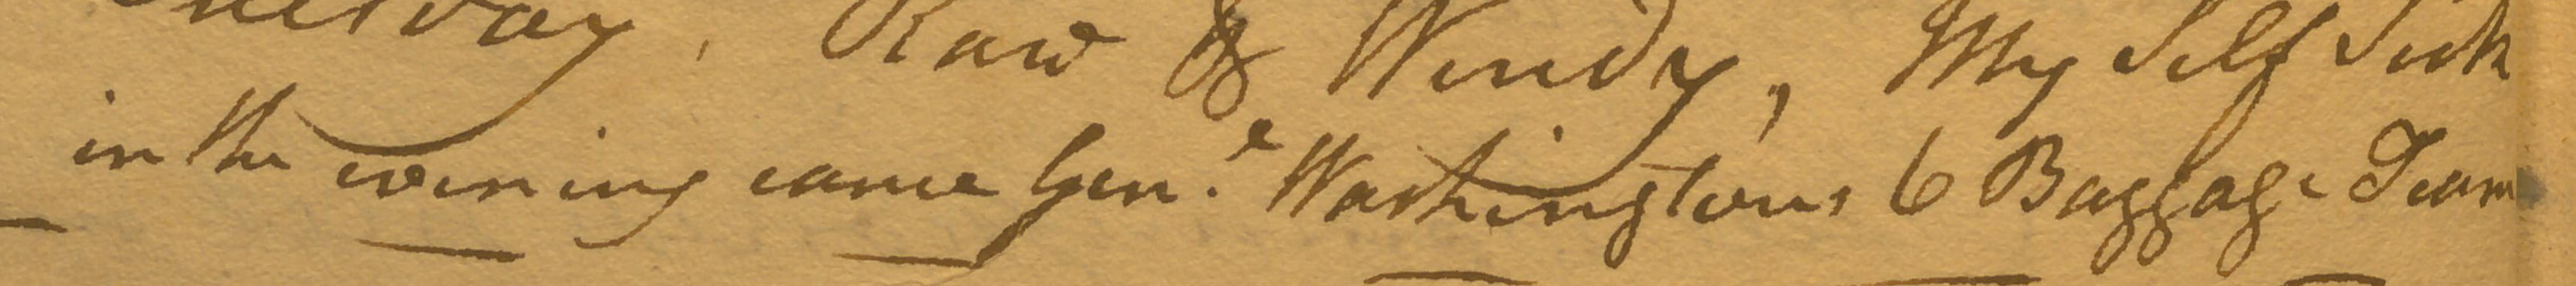in the evening came Gen^l. Washingtons 6 Baggage Team
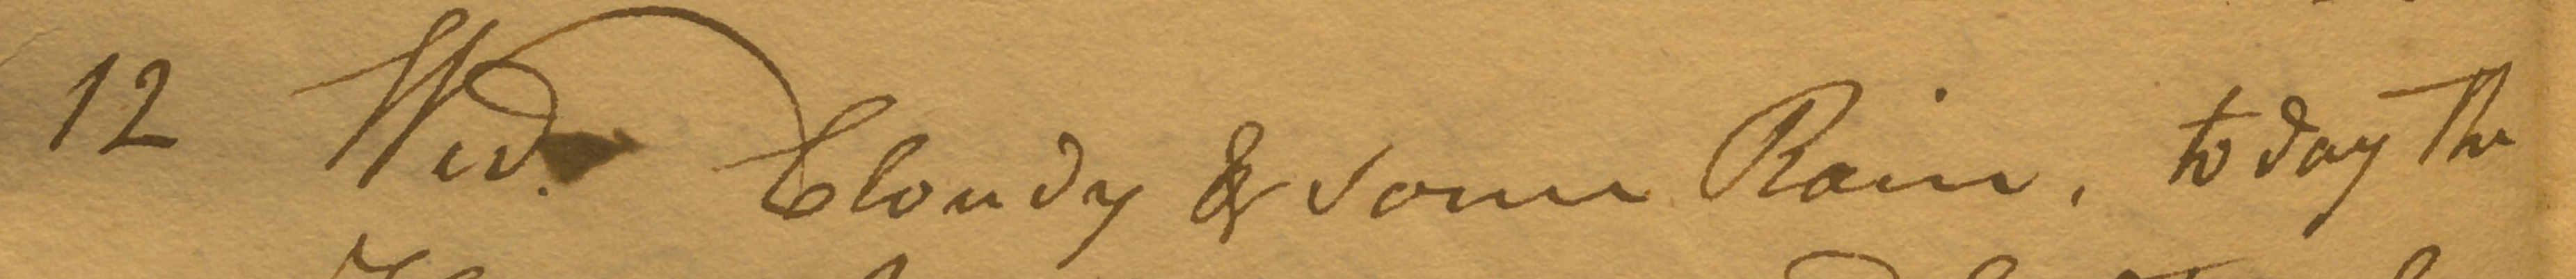12 Wedr Cloudy & some Rain, to day the
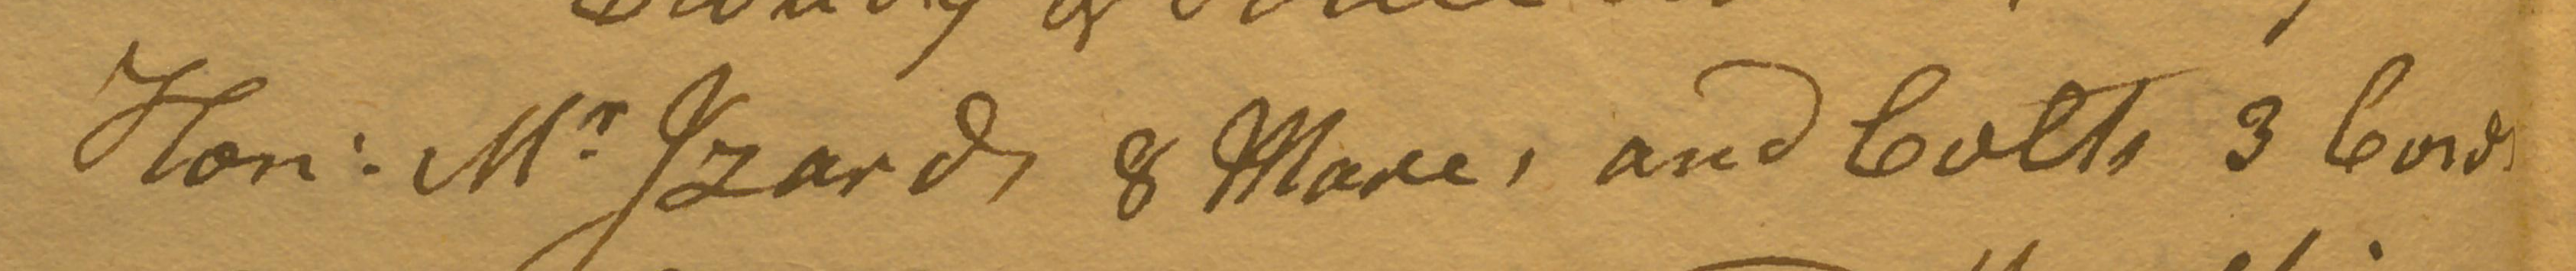Hon: M^r. Izards 8 Mare, and Colts 3 Cow
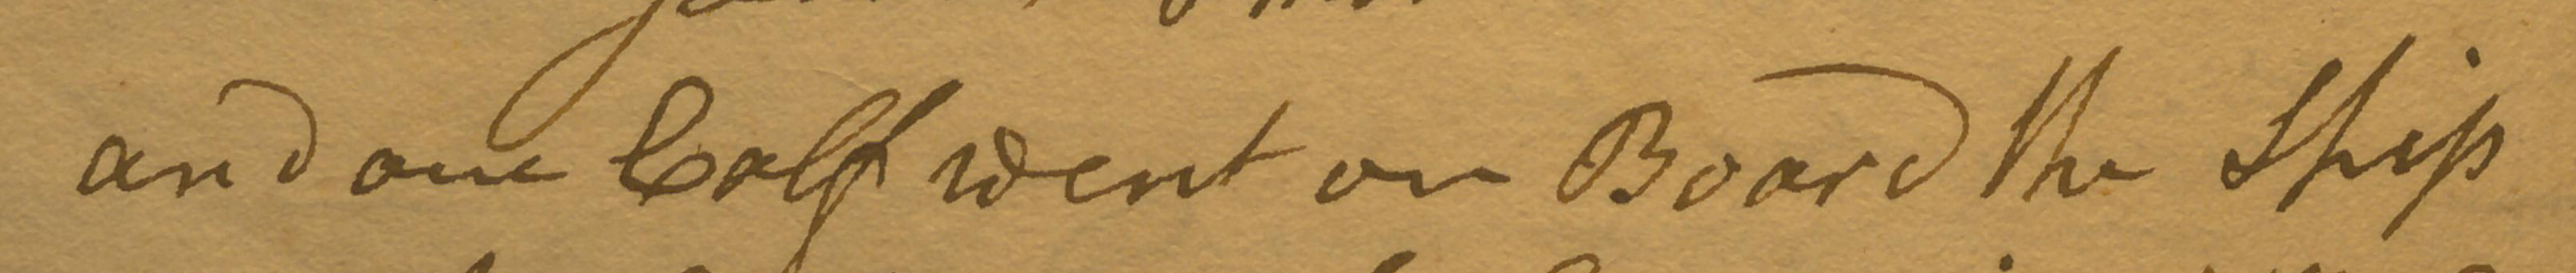and one Calf went on Board the Ship
